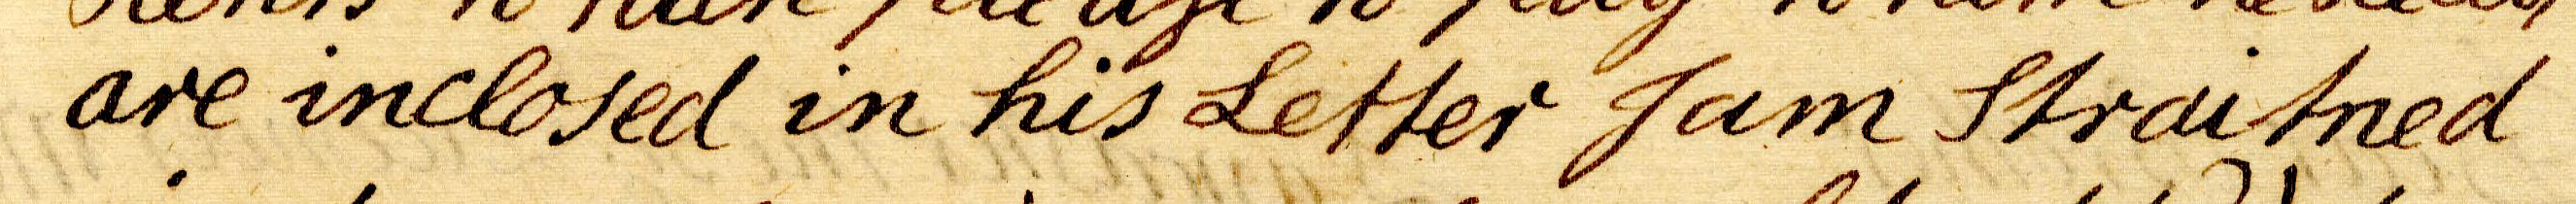are inclosed in his Letter I am Straitned
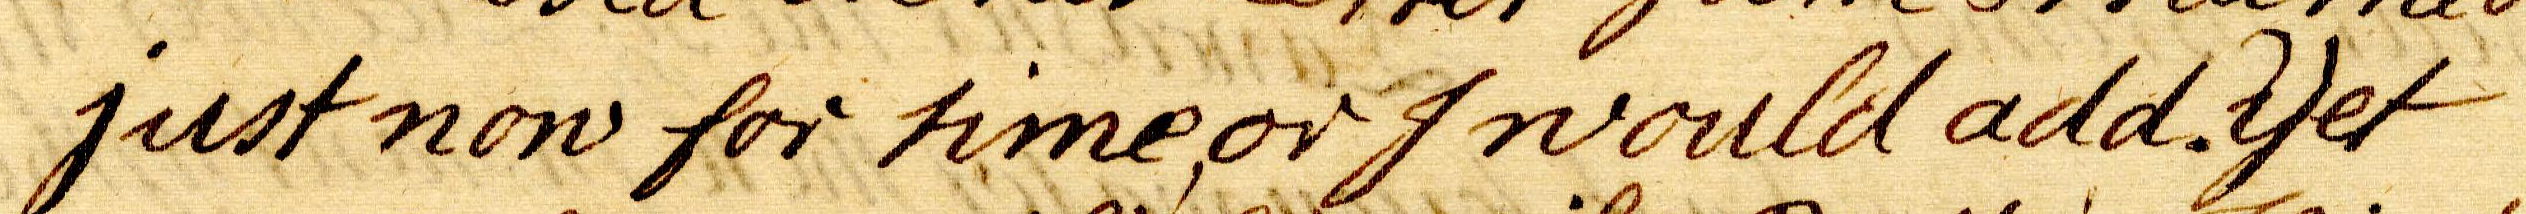just now for time or I would add. Yet
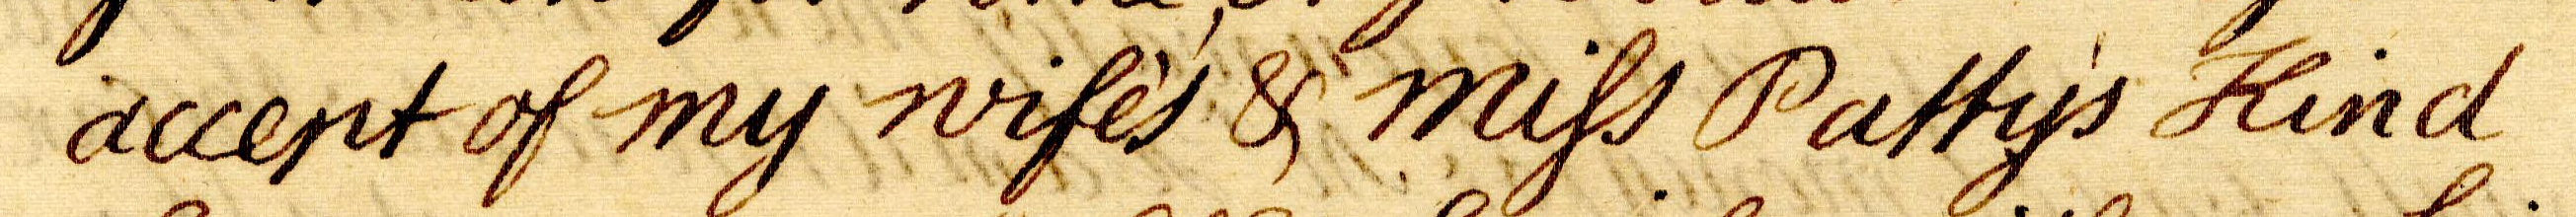accept of my wife's & Miss Patty's Kind
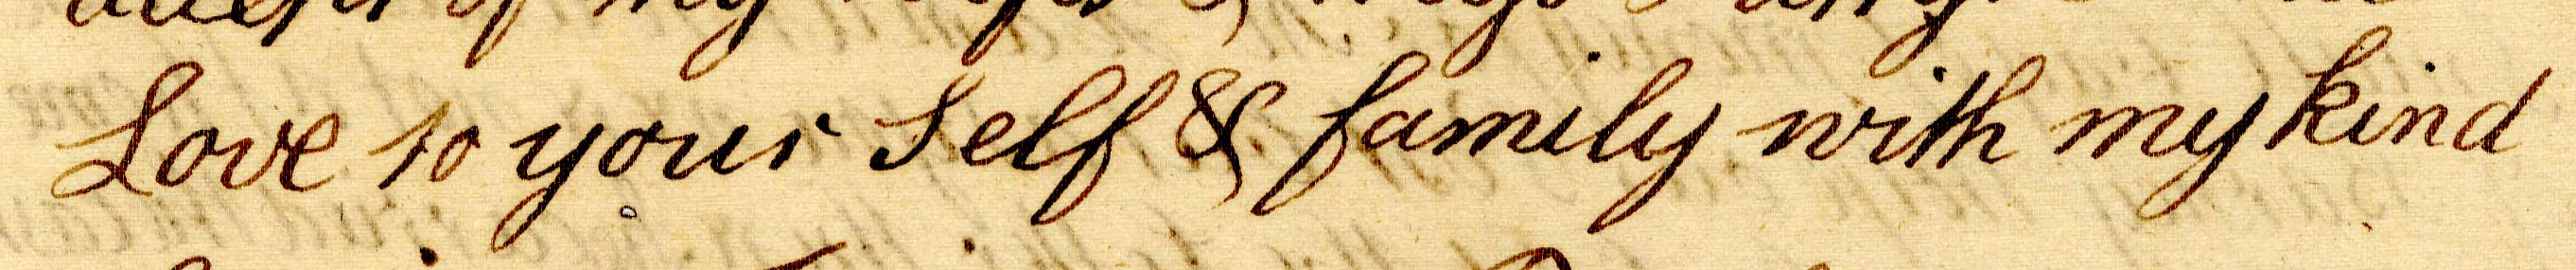Love to Your Self & family with my kind
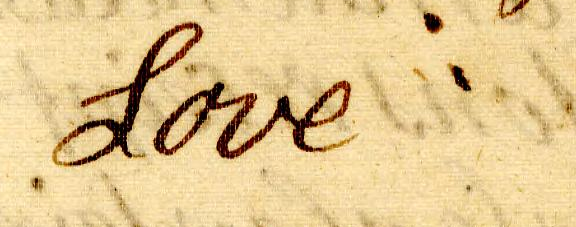Love :
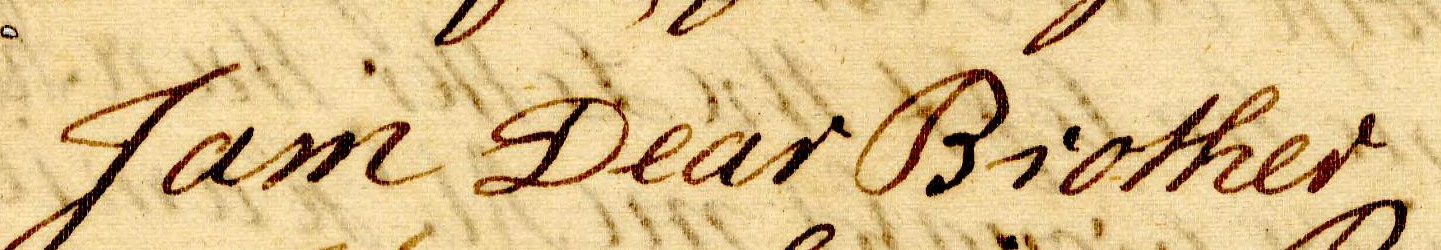I am Dear Brother
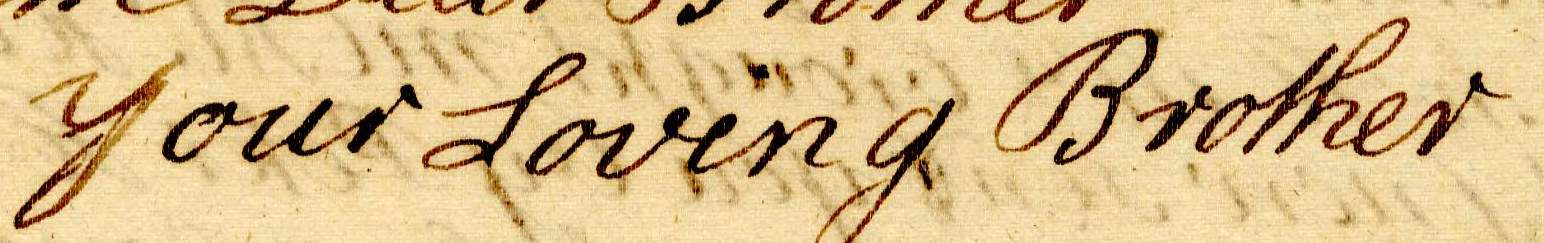Your Loving Brother
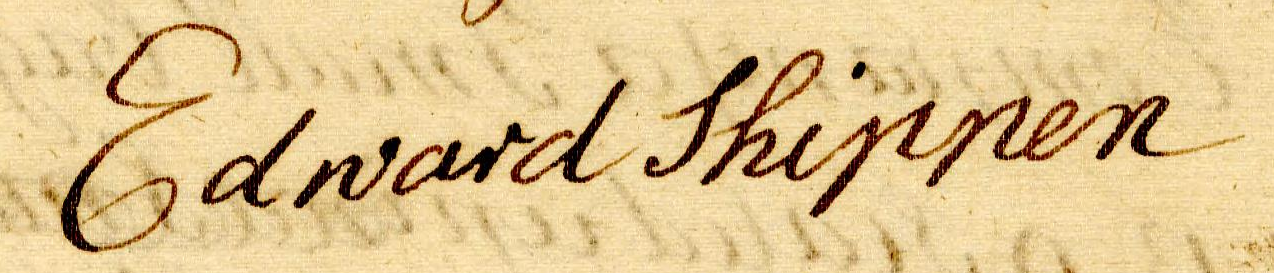Edward Shippen
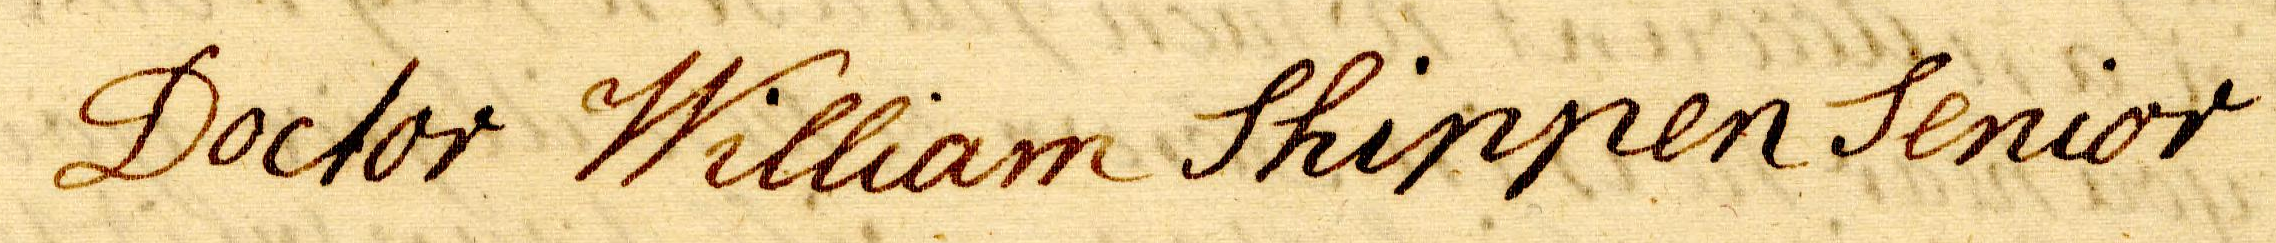Doctor William Shippen Senior
